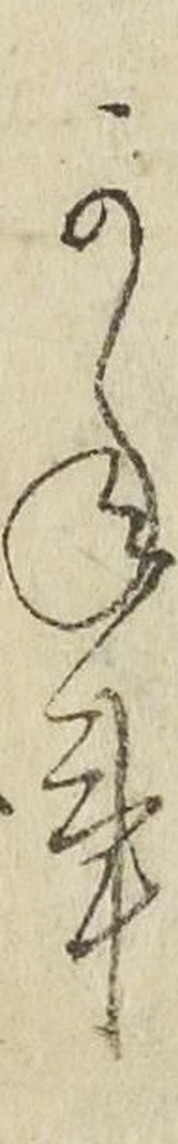かね事
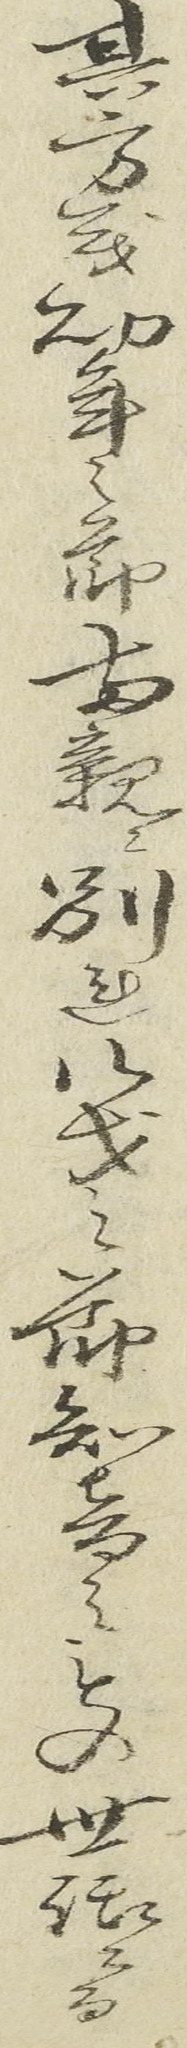其方義幼年之節両親ニ別れ八才之節知者之もの世話ニ而

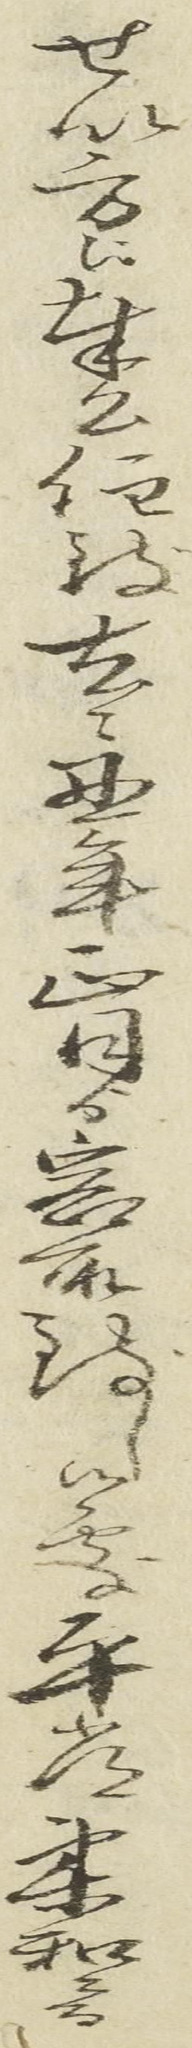せい方え奉公住致去去々丑年正月ゟ客取致し候処平常柔和ニ而
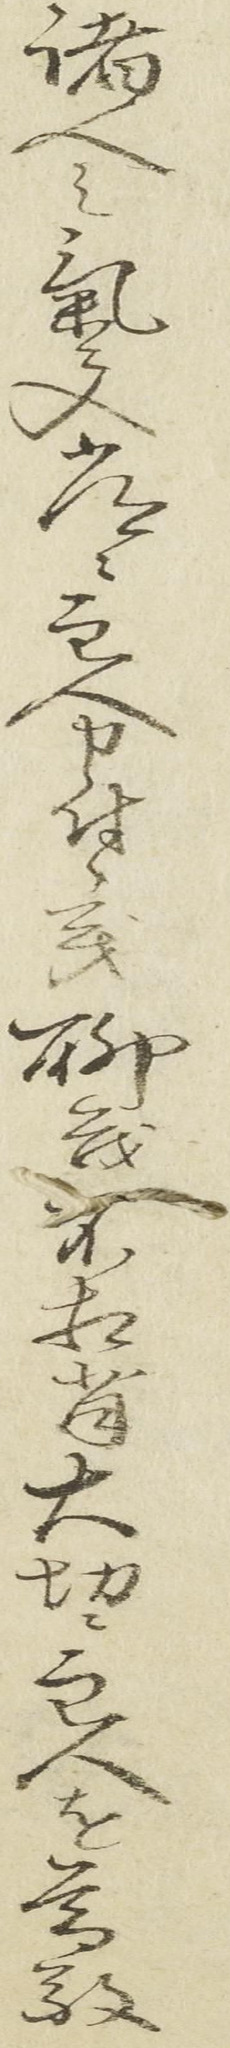諸人之気二入常々主人申付候義聊茂不相背大切二主人を尊敬
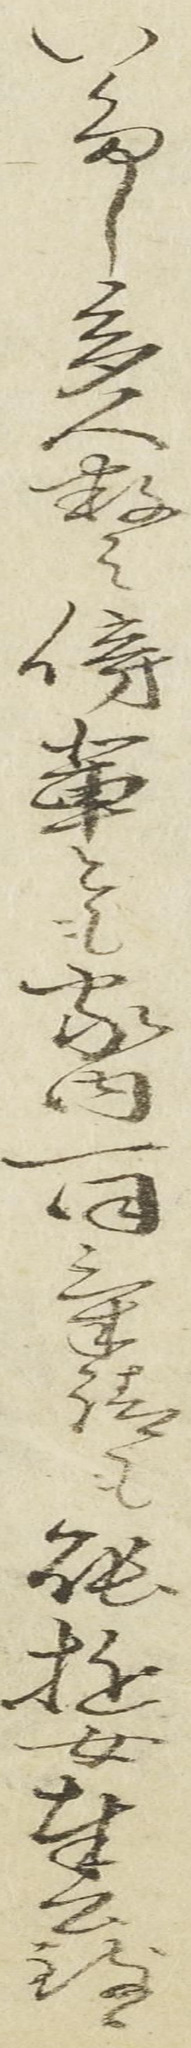いたし多人数之傍輩とも家内一同気請も能遊女奉公致候
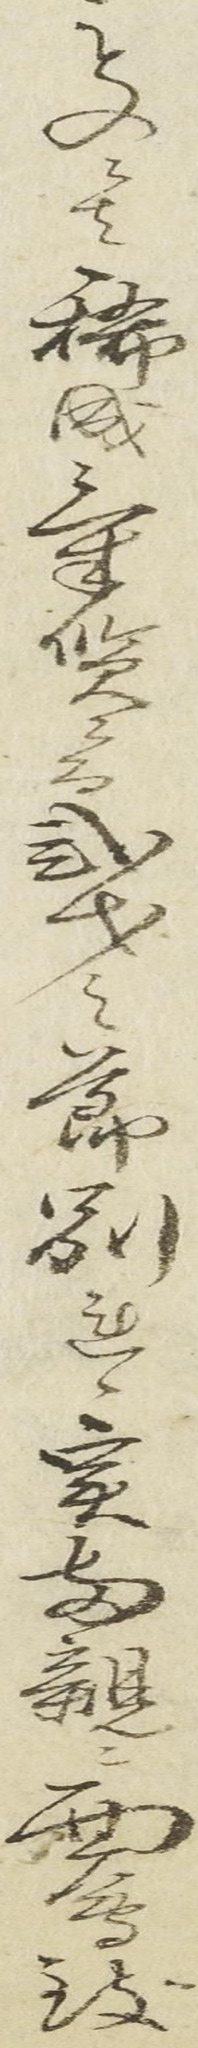ものニは稀成気質ニ而弐才之節別れ候実両親ニ面会致
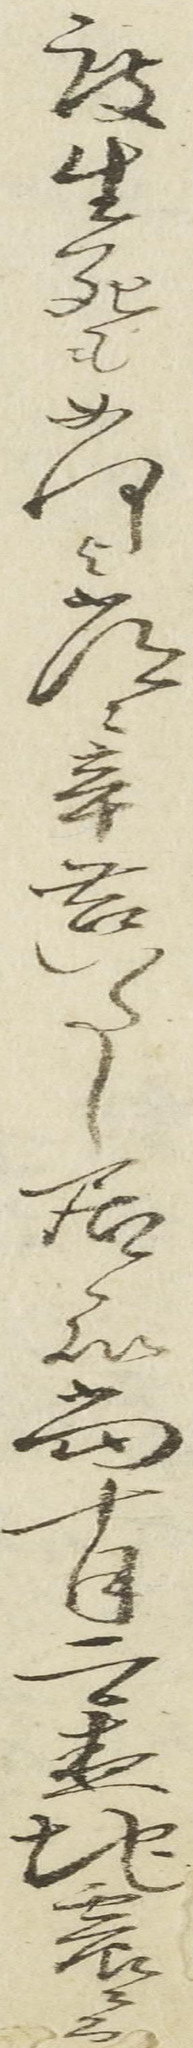度生死も如何と常々辛苦いたし居候処当十月二日夜地震ニ而
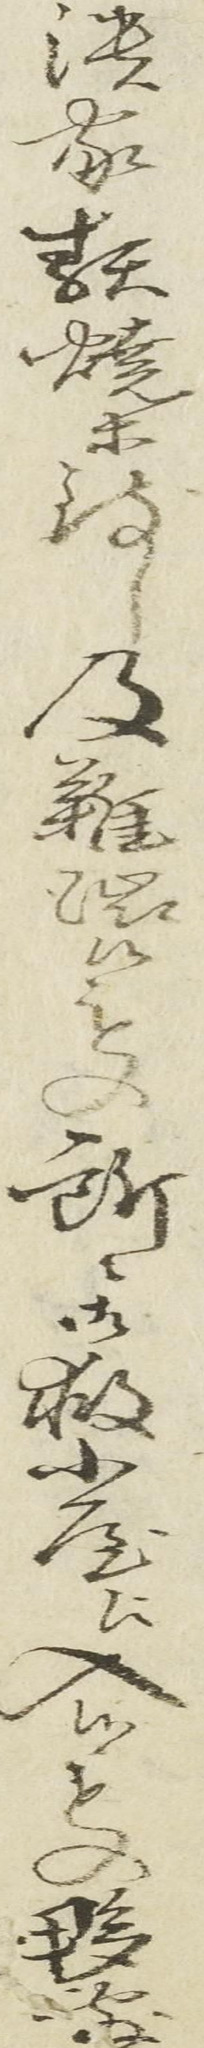潰家類焼等致し及難渋候もの所々御救小屋え入候もの夥敷
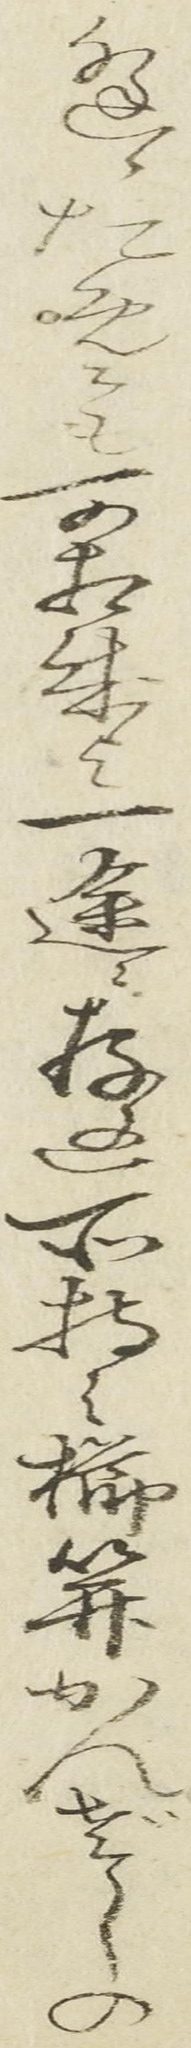逢候ためニも可相成と一途二存込所持之櫛笄かんざしの
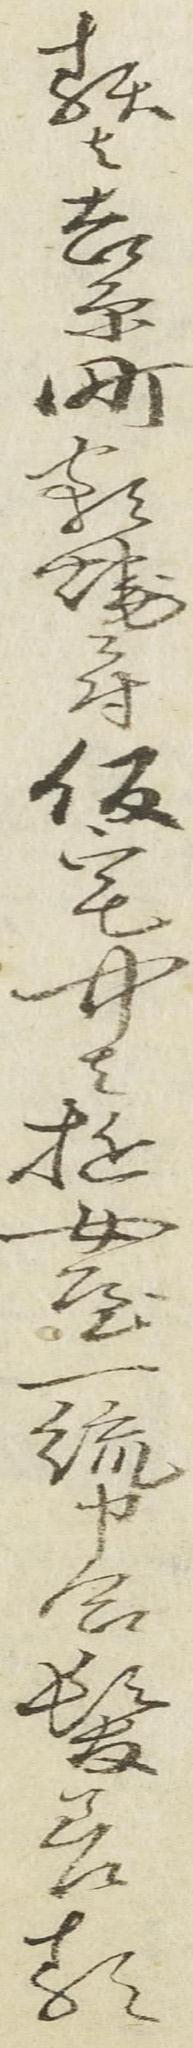類は吉原町類焼ニ付仮宅中は遊女屋一統申合髪差類
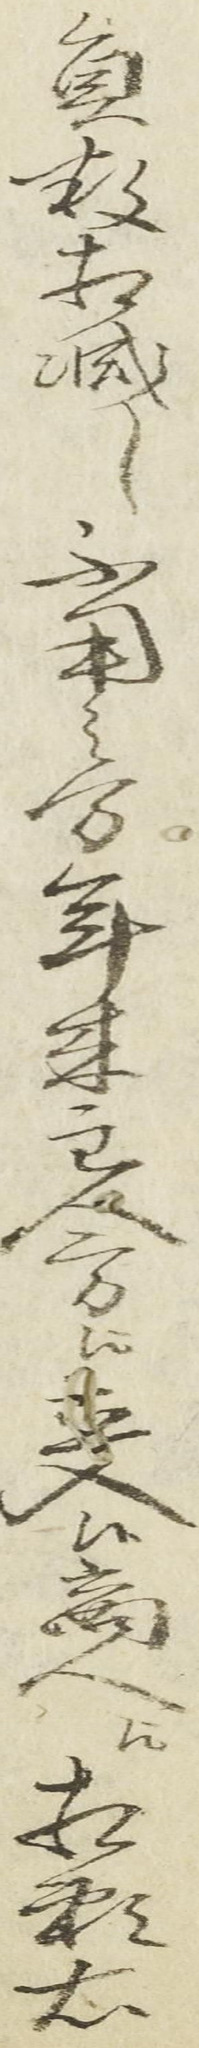員数相減じ不用之分年来主人方え立入候商人え相頼右
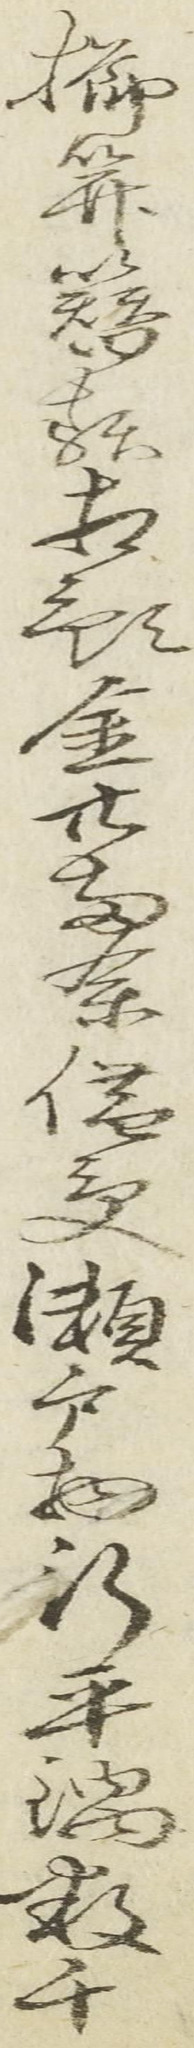櫛笄簪類相預金廿両余借受瀬戸物行平鍋数千
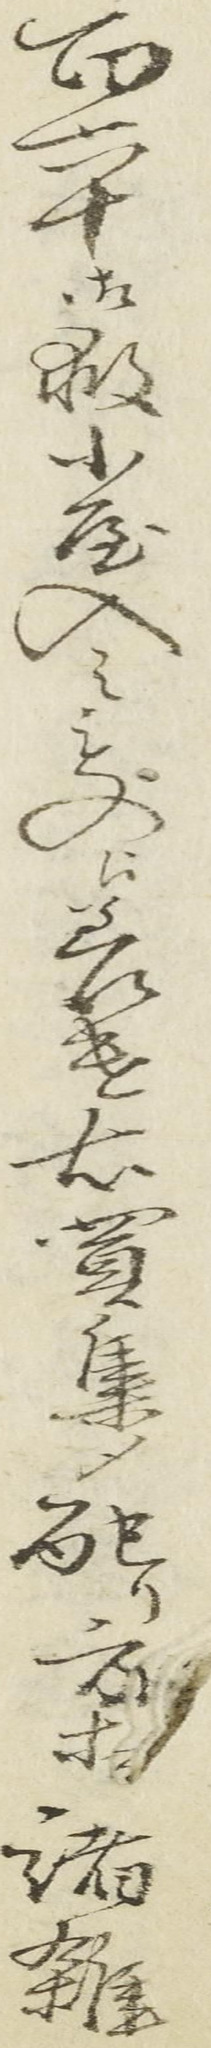百六十御救小屋入之ものえ差遣右買集メ配り方等諸雑
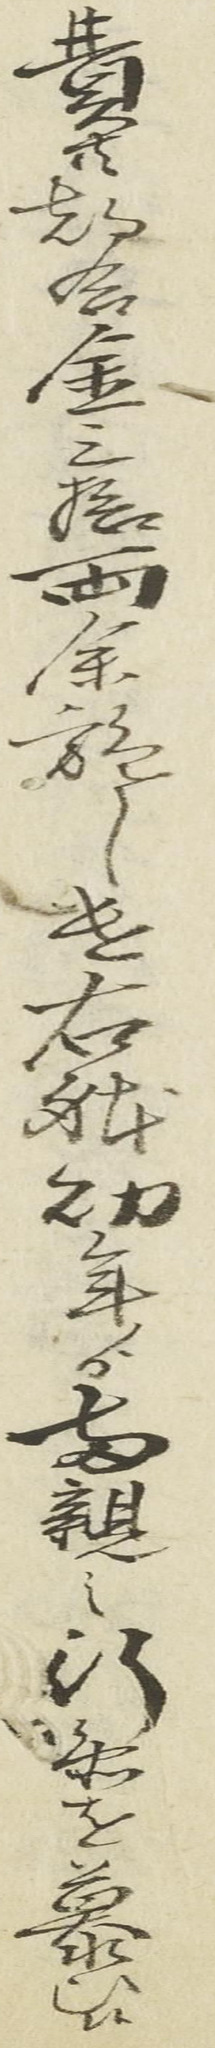費共都合金三拾両施し遣右躰幼年ゟ両親之行衛を慕ひ候
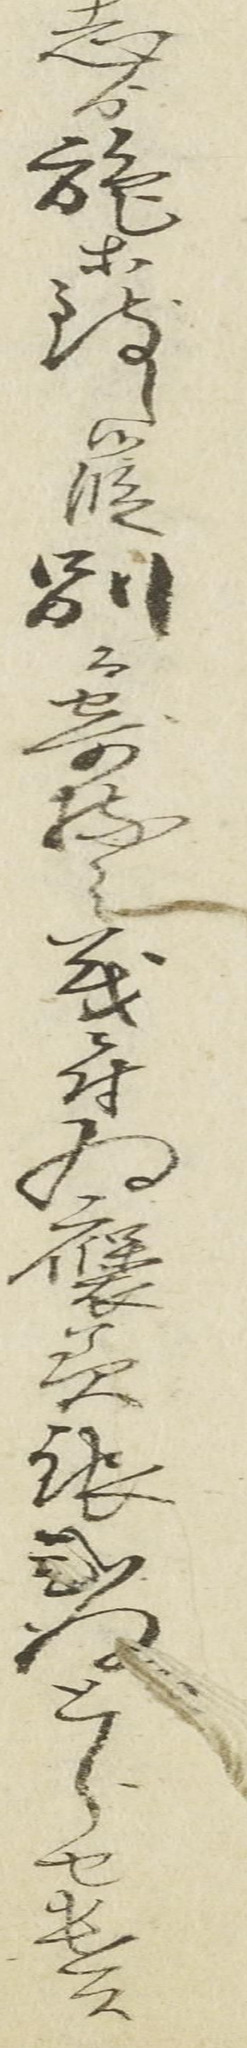志ゟ施等致し候段別而奇特之義ニ付為褒美銀弐匁とらせ遣ス
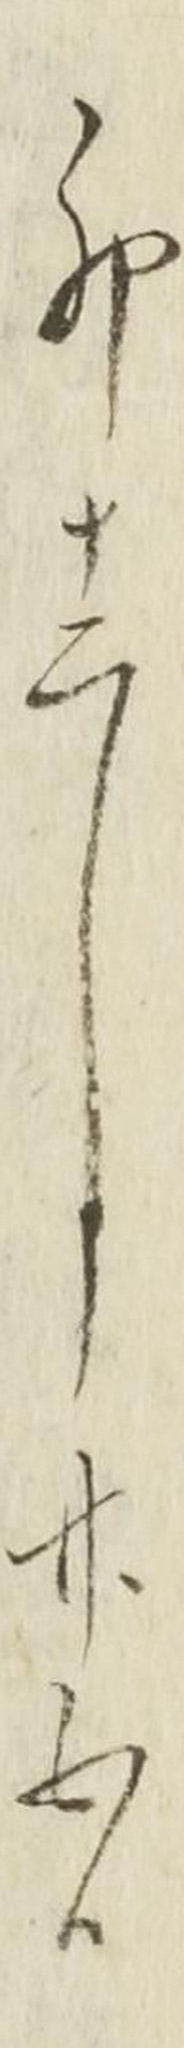卯十二月廿五日
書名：安政二乙卯年十月二日大地震之事
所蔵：東京大学地震研究所図書室 Earthquake Research Institute Library, The University of Tokyo, JAPAN
